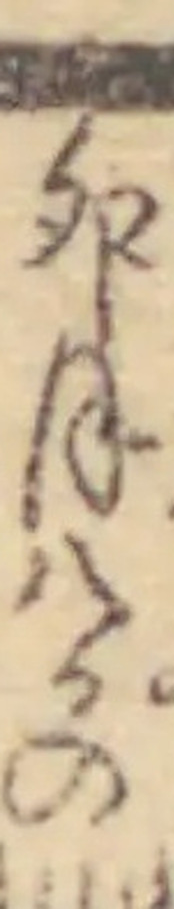卯月八日の
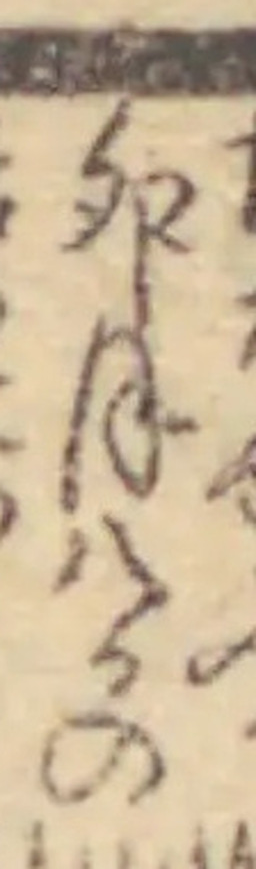卯月八日の
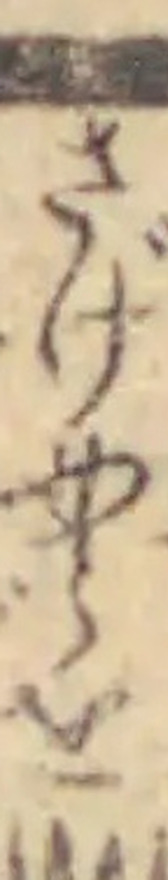さげやらせ
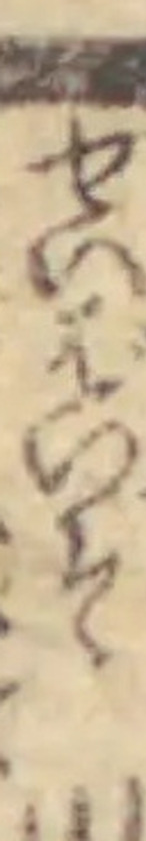せいばいぞ
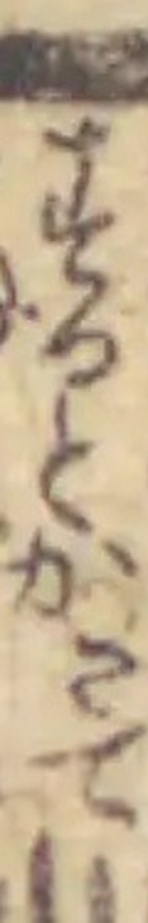するとかきて
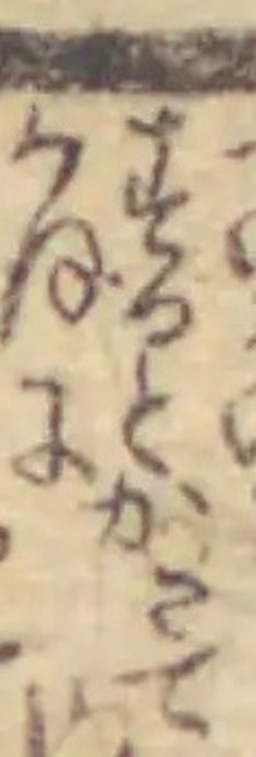かほに
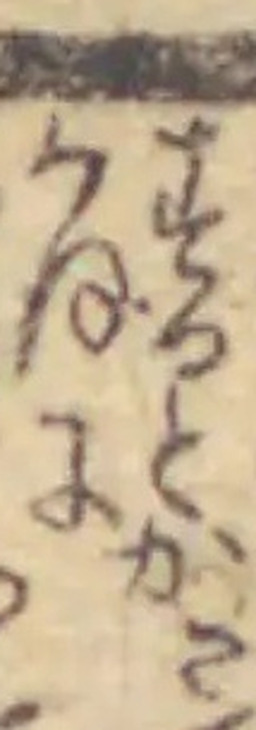かほに
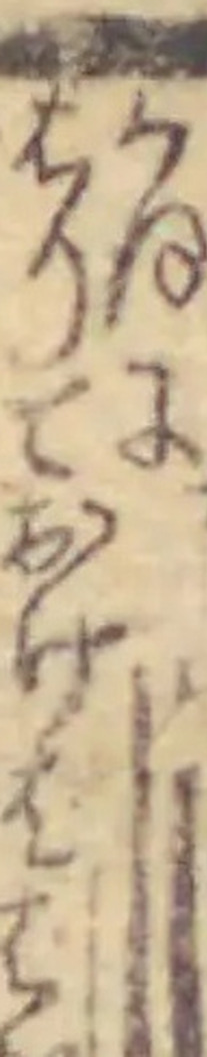はりておけははを
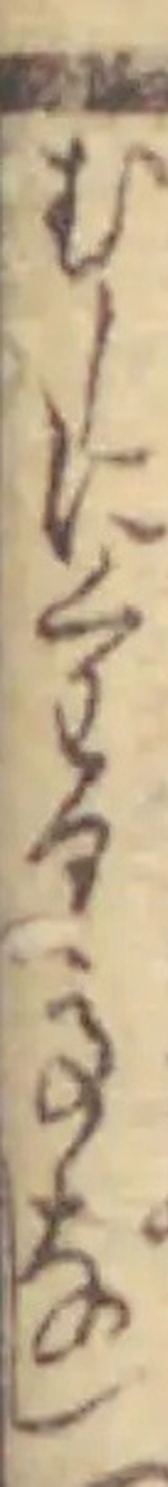むしにくわるゝ事なし
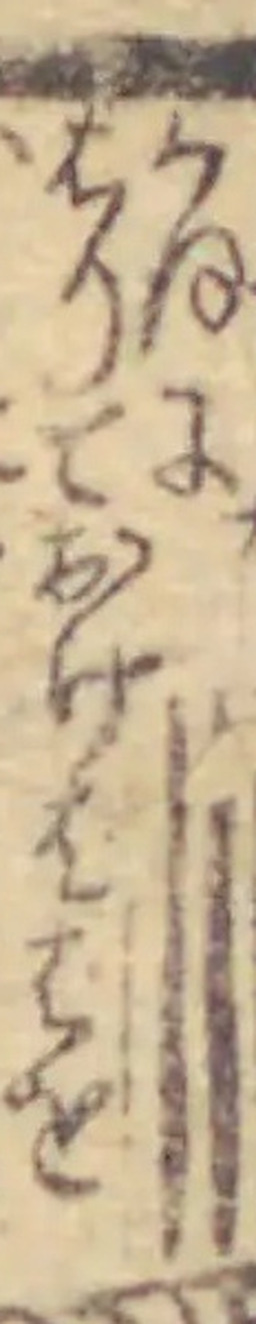はりておけははを
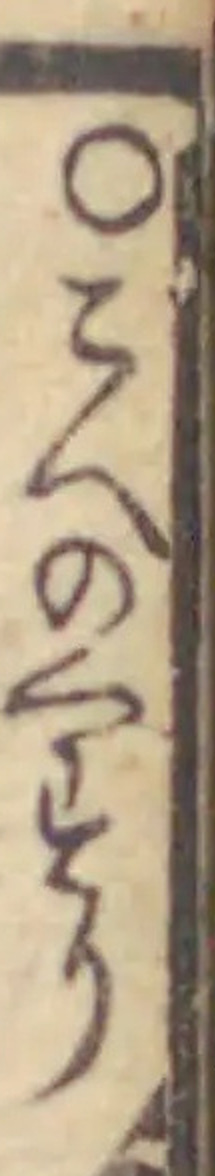○こへのくすり
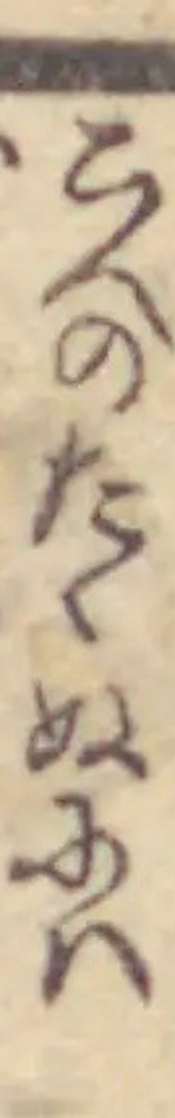こへのたゝぬには
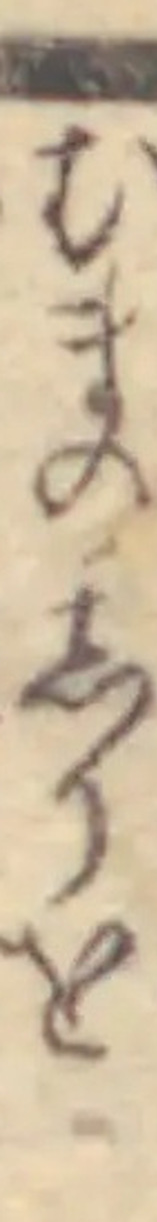むまのしりを
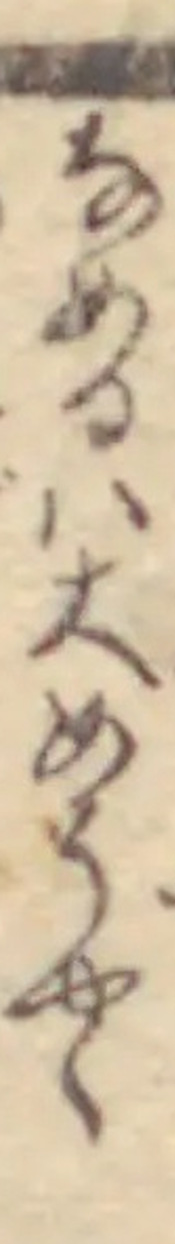なめるは大めうやく
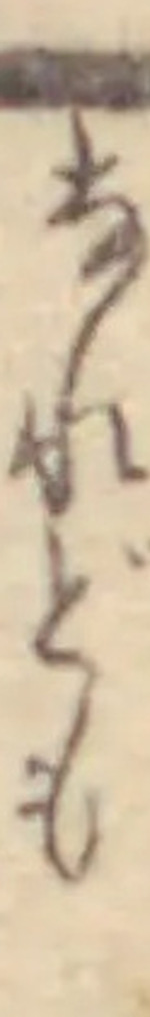なれども
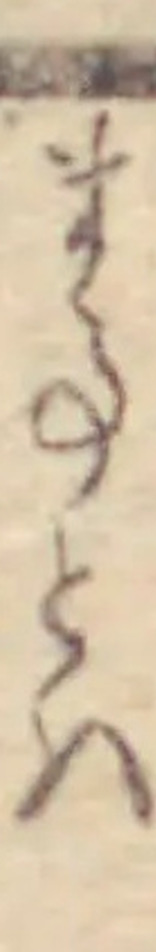ま事とは
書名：家伝寿命薬 2巻
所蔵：国立国会図書館 National Diet Library, JAPAN
